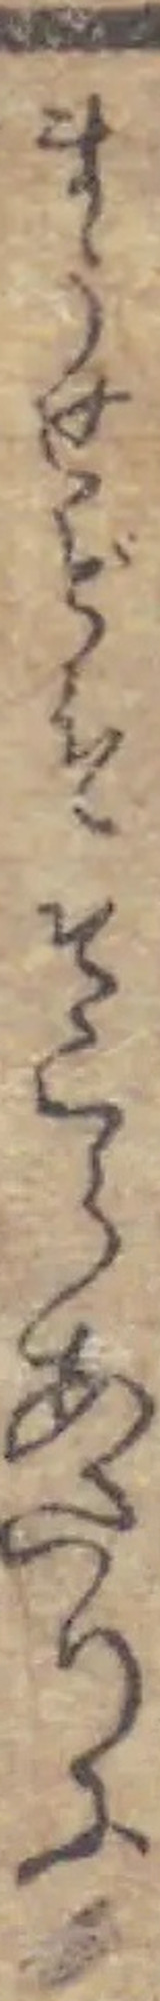まうせどもそこらあたりに
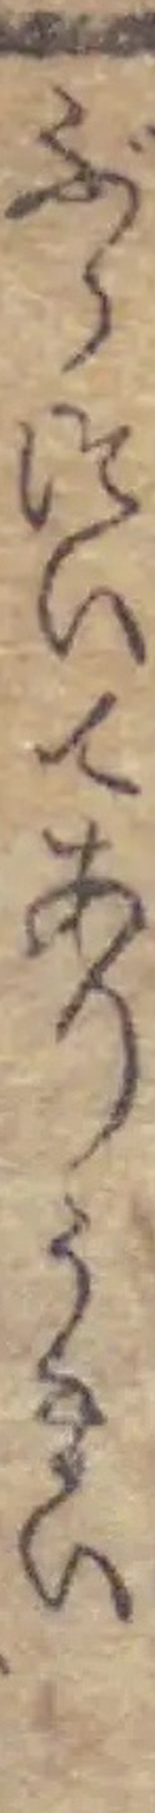ぶらついてありうまい
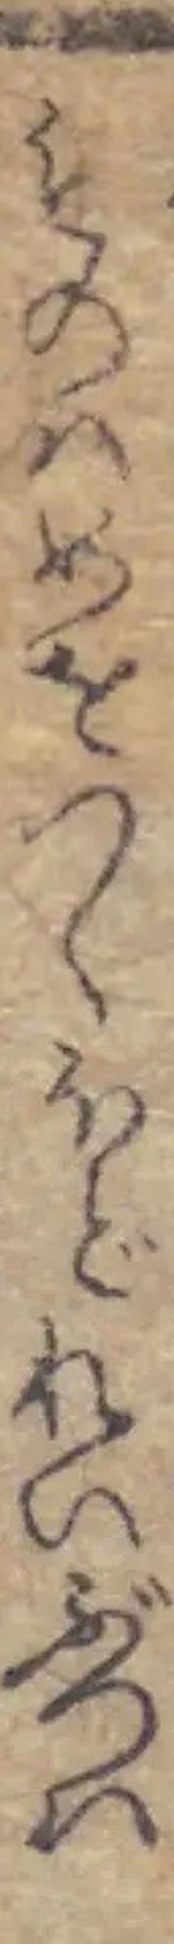ものハめをつくほどれいぶつハ
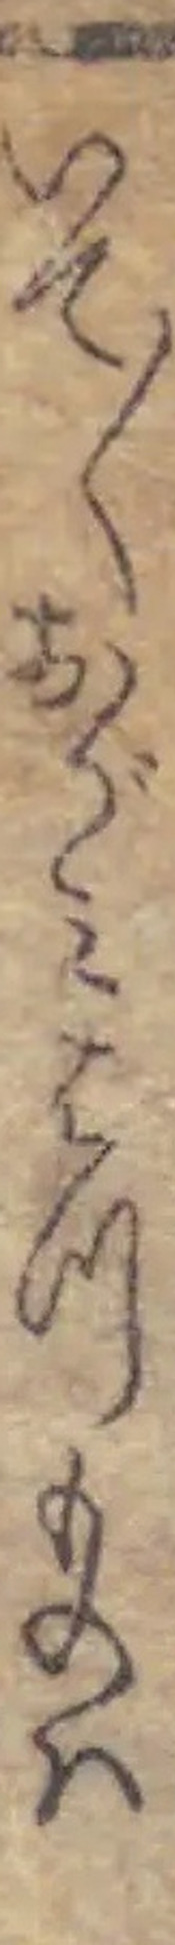いて〳〵おがミはつものハ
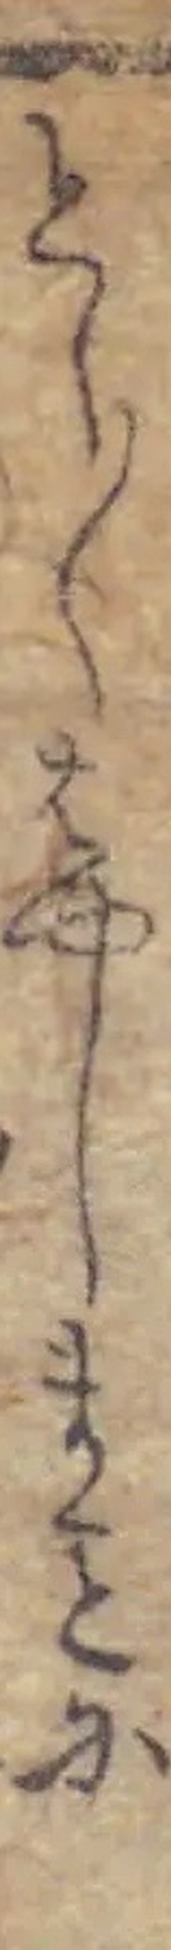とし〳〵はやしまことに
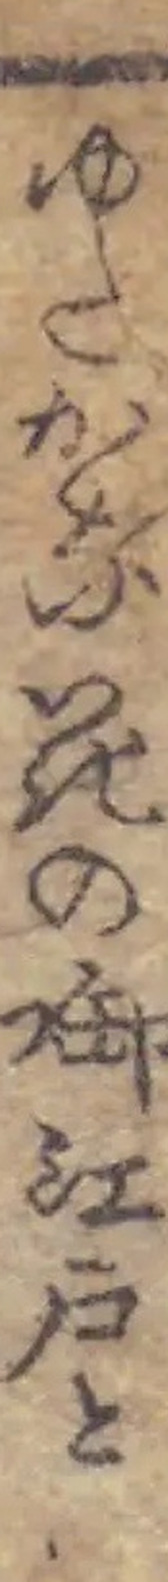ゆたかな花の御江戸と
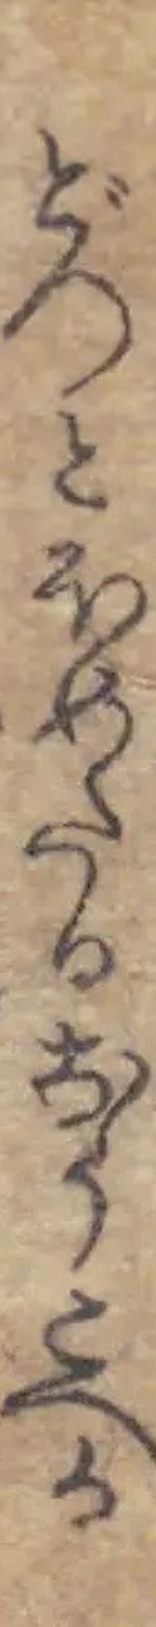どつとほめたるおうこへか
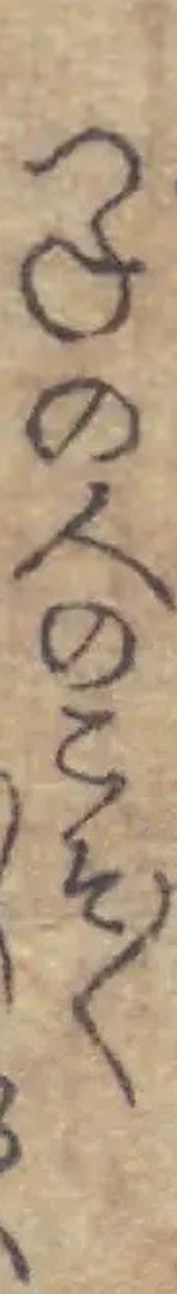つねの人のこそ〳〵
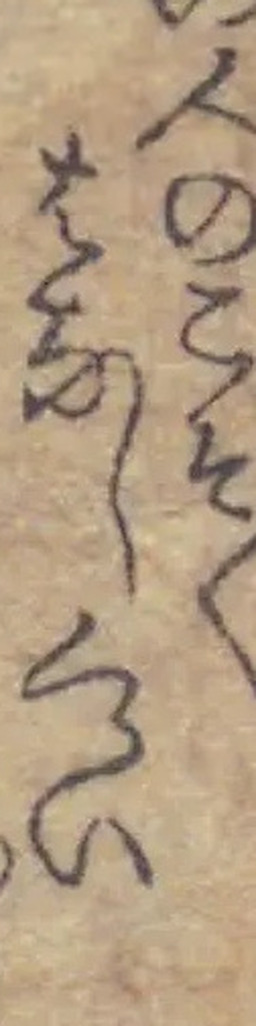はなしくらい
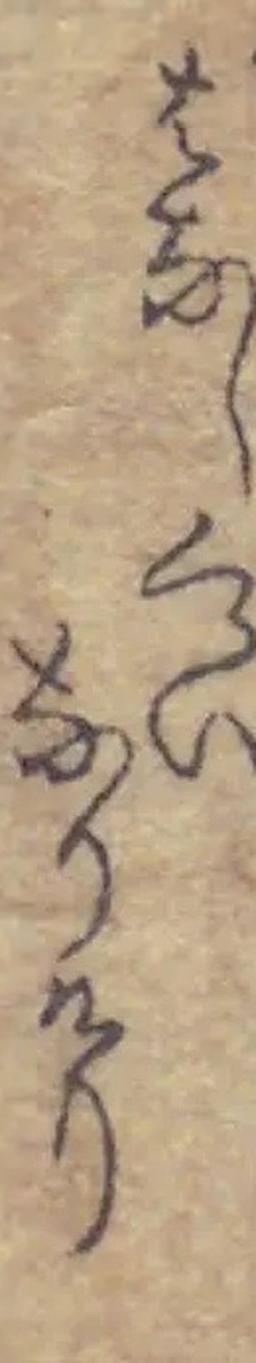なりけり
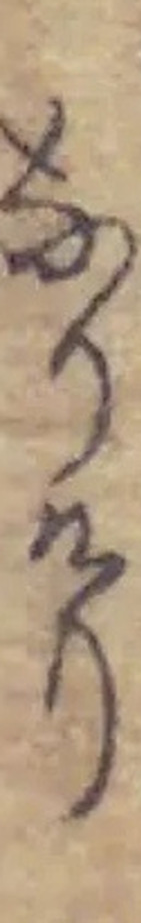なりけり
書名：豆男江戸見物 2巻
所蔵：国立国会図書館 National Diet Library, JAPAN
